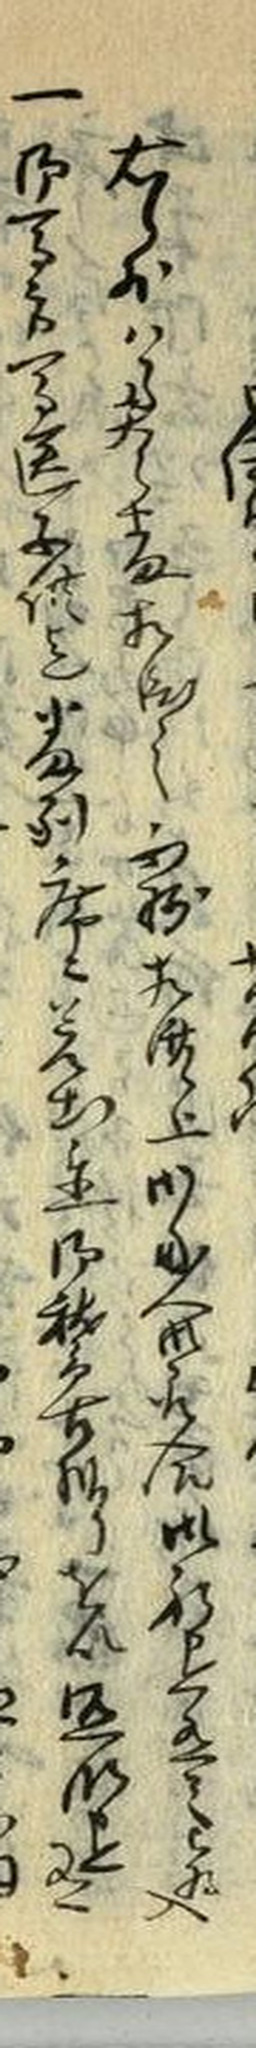一御馬方馬医子供迄番列席ニ差出置御稽古掛りを以申上有
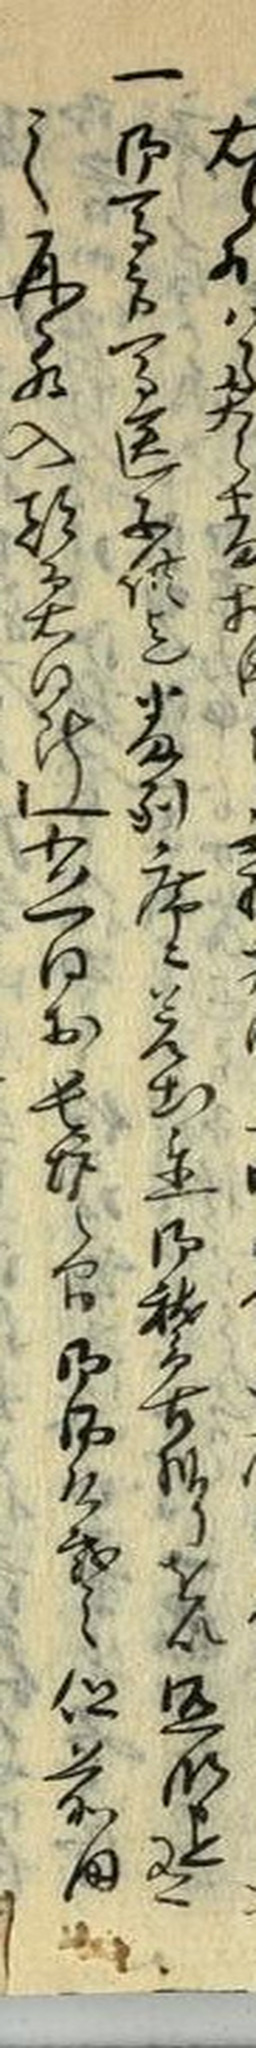之再被為入都而右同断」右一同於長炉之間御酒頂戴之但前田
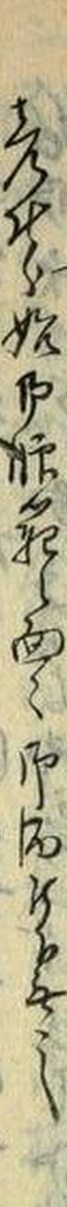彦次郎始御師範之面々御酒被下無之
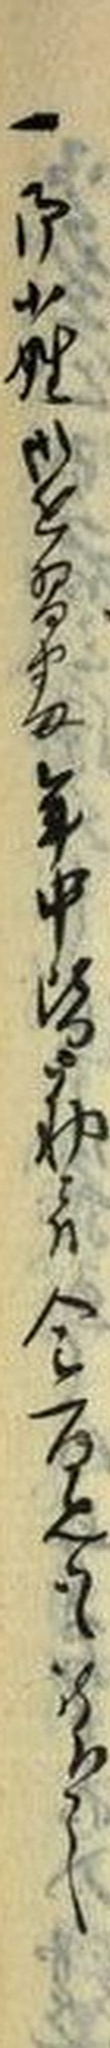一御小姓御近習番年中皆勤ニ付金百疋ツヽ被下之
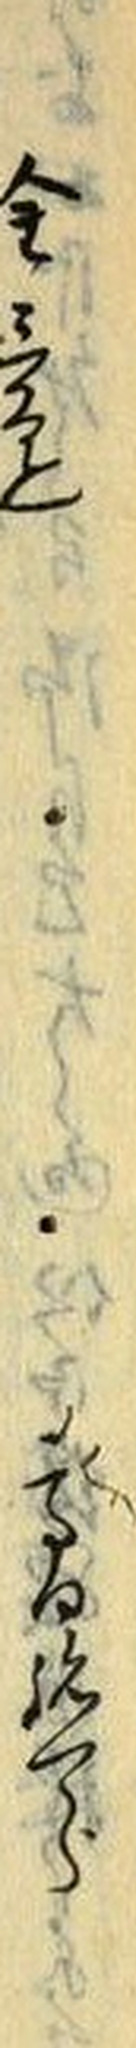金三百疋高田弥一郎
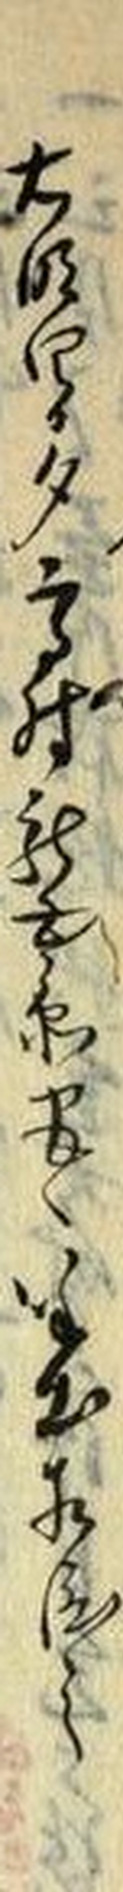右明四日夕高村新五兵衛宅へ差出相渡之
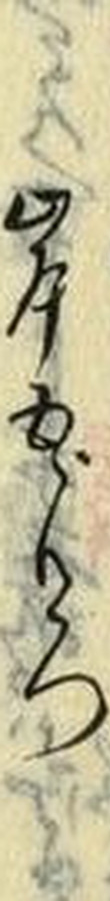岸五郎左衛門
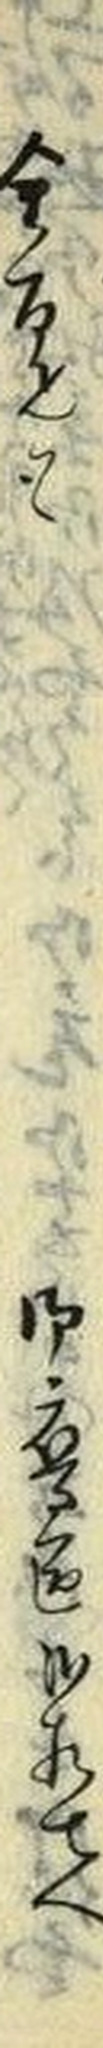金百疋ツヽ御鷹匠弐拾七人
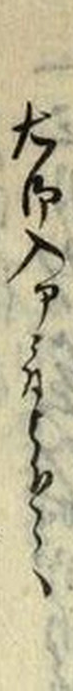右御入部ニ付被下之
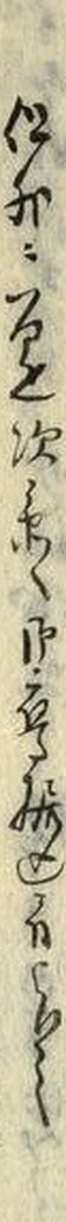但外ニ百疋次兵衛へ御鷹据込ニ付被下之
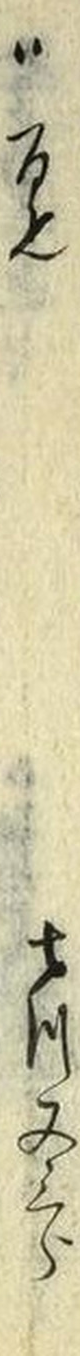同百疋才川又三郎
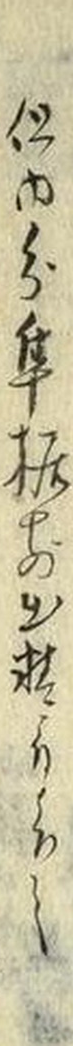但内分隼据前出精ニ付被下之
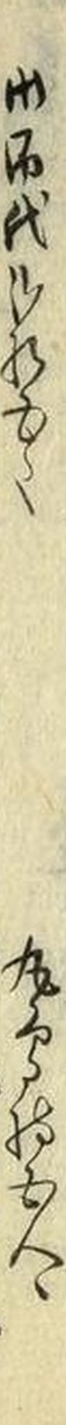御酒代弐拾五匁丸鳥持五人へ
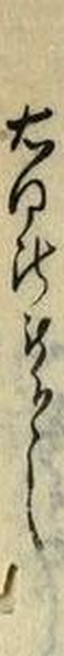右同断被下之
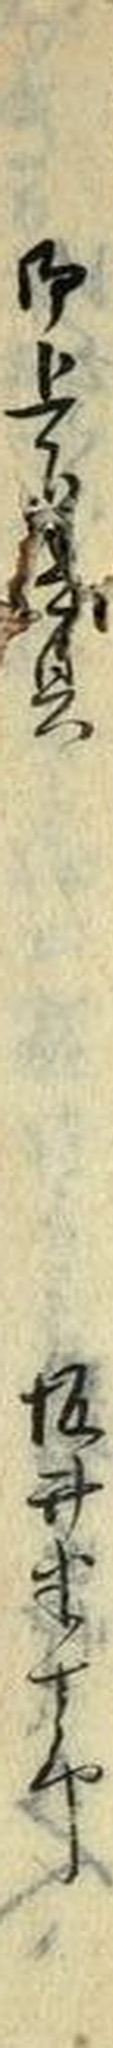御上下壱具坂井半十郎

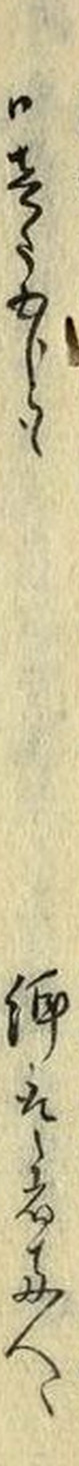同壱匁五分ツヽ餌取之者両人へ
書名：少傅日録抄（斉承付側向頭取日記、在国）
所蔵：福井県文書館 Fukui Prefectural Archives
